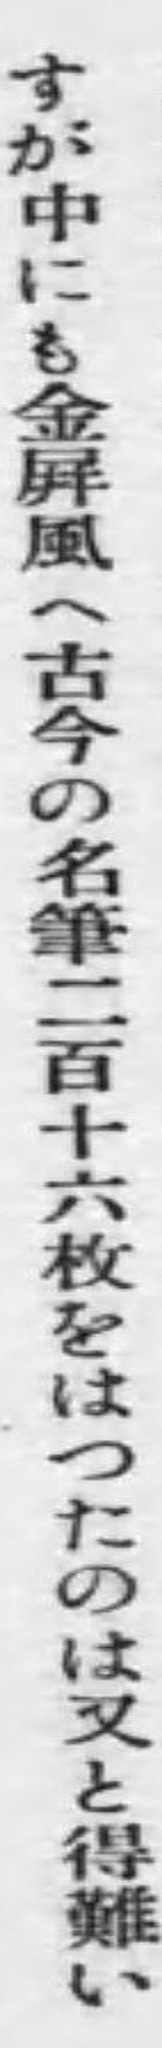すが中にも金屏風へ古今の名筆二百十六枚をはつたのは又と得難い
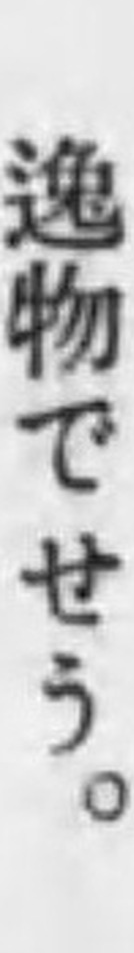逸物でせう。
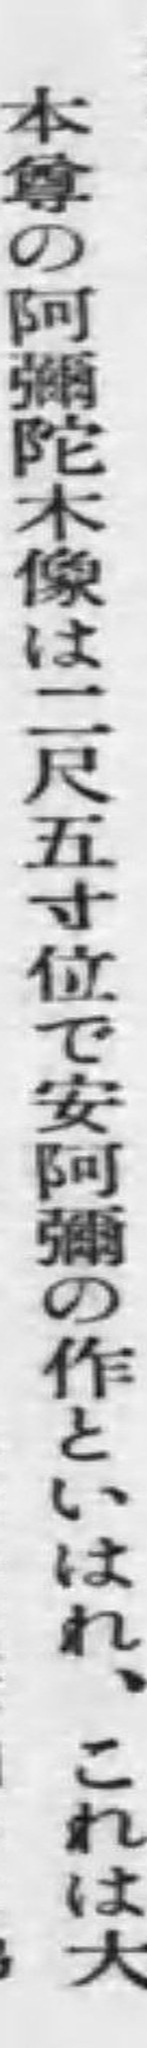本尊の阿弥陀木像は二尺五寸位で安阿弥の作といはれ、これは大
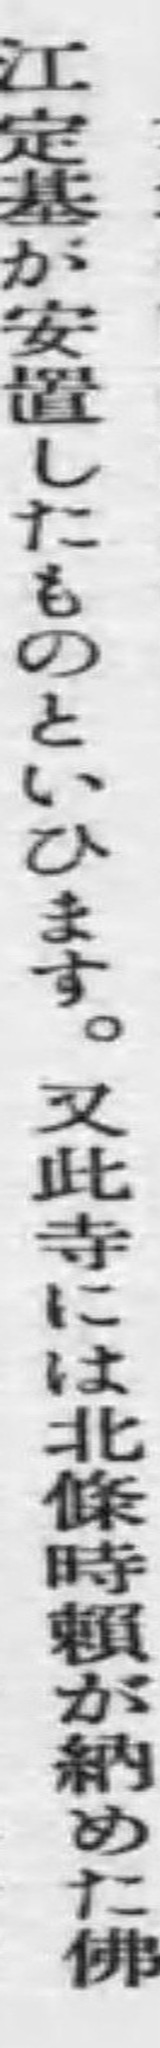江定基が安置したものといひます。又此寺には北条時頼が納めた仏
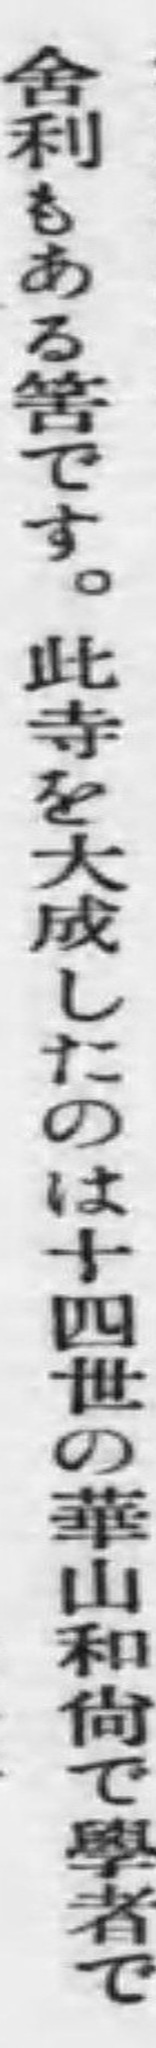舎利もある筈です。此寺を大成したのは十四世の華山和尚で学者で
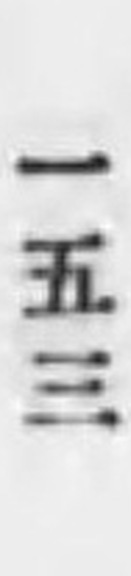一五三

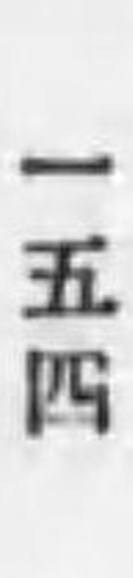一五四
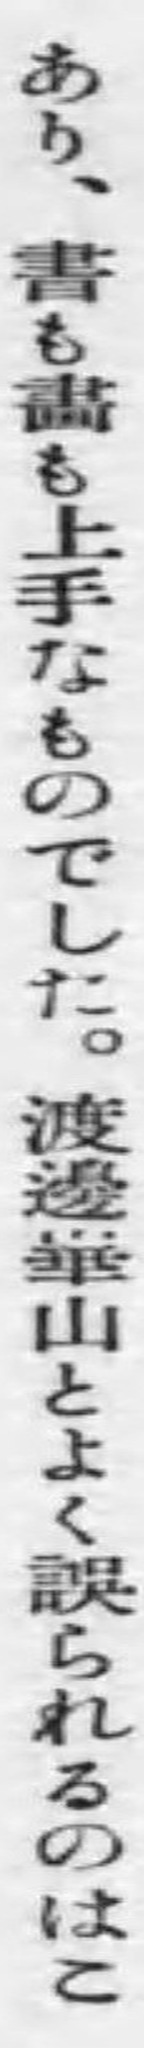あり、書も画も上手なものでした。渡辺崋山とよく誤られるのはこ
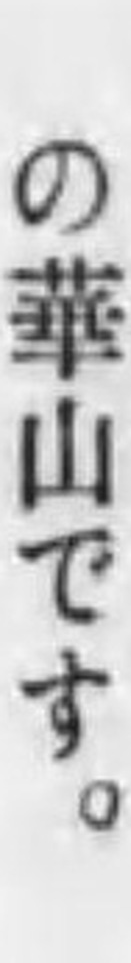の華山です。
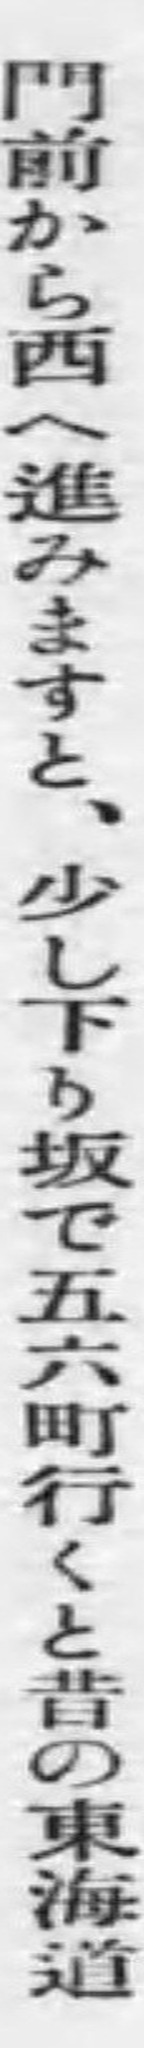門前から西へ進みますと、少し下り坂で五六町行くと昔の東海道
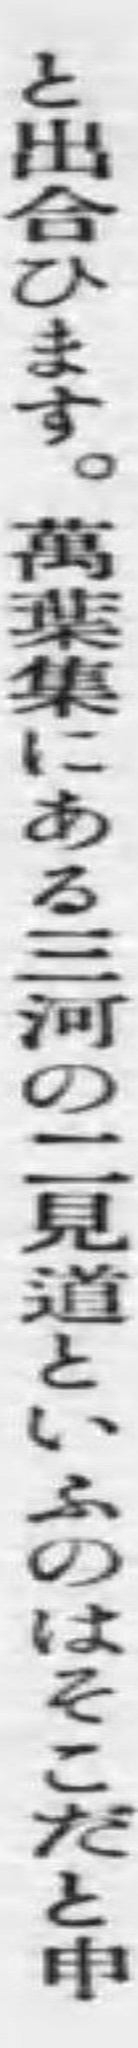と出合ひます。万葉集にある三河の二見道といふのはそこだと申
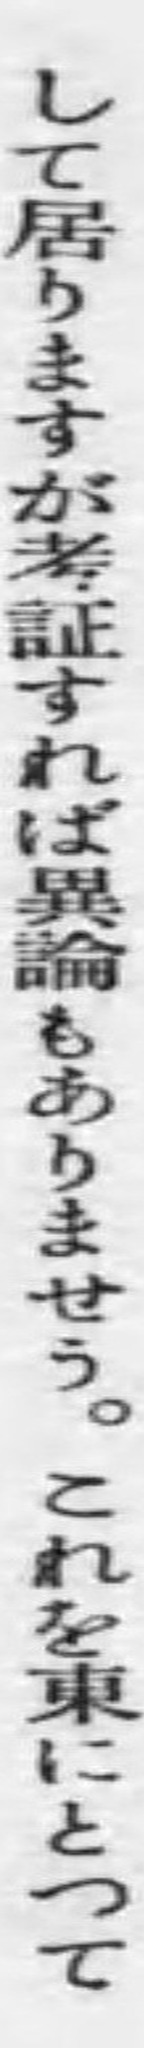して居りますが考証すれば異論もありませう。これを東にとつて
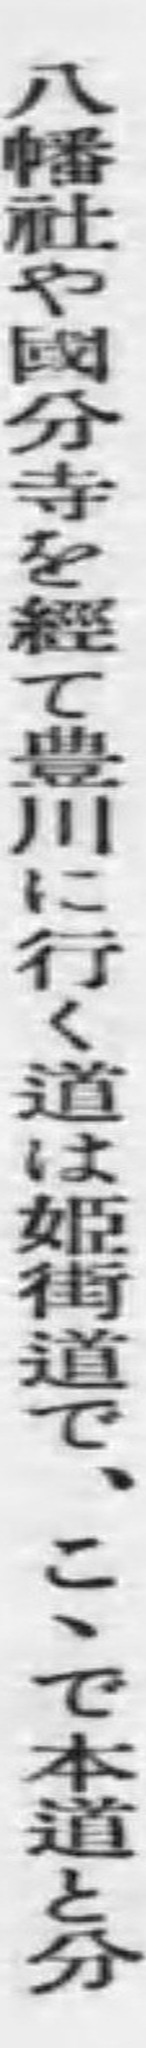八幡社や国分寺を経て豊川に行く道は姫街道で、こゝで本道と分
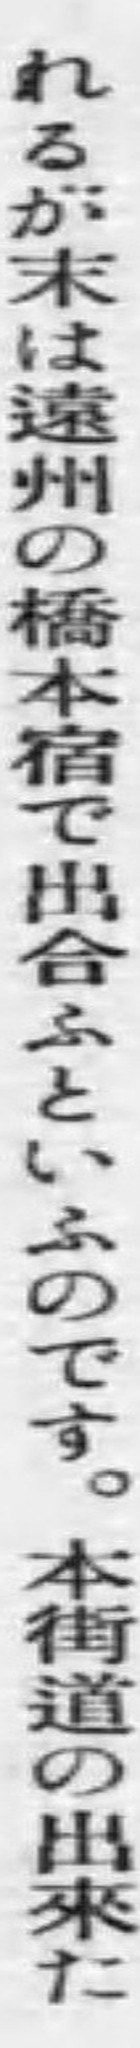れるが末は遠州の橋本宿で出合ふといふのです。本街道の出来た
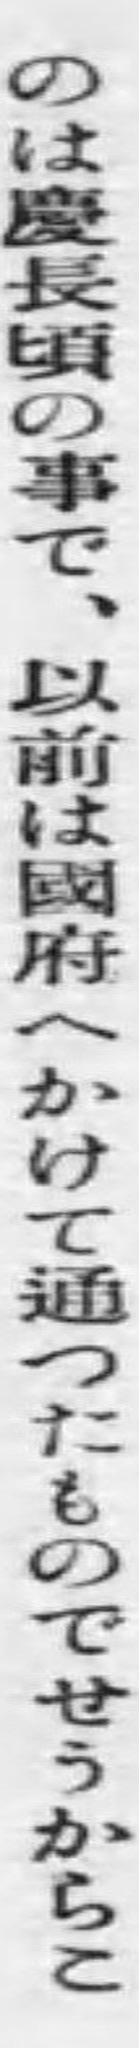のは慶長頃の事で、以前は国府へかけて通つたものでせうからこ
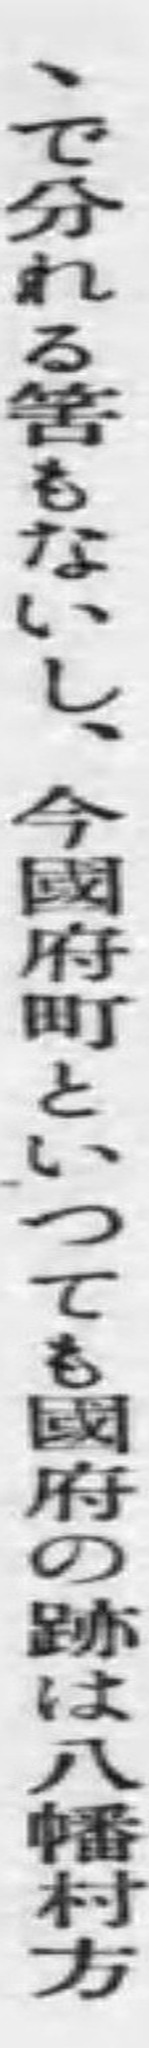ゝで分れる筈もないし、今国府町といつても国府の跡は八幡村方
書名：東三河道中記 : 豊橋市及其附近案内
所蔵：国立国会図書館 National Diet Library, JAPAN
